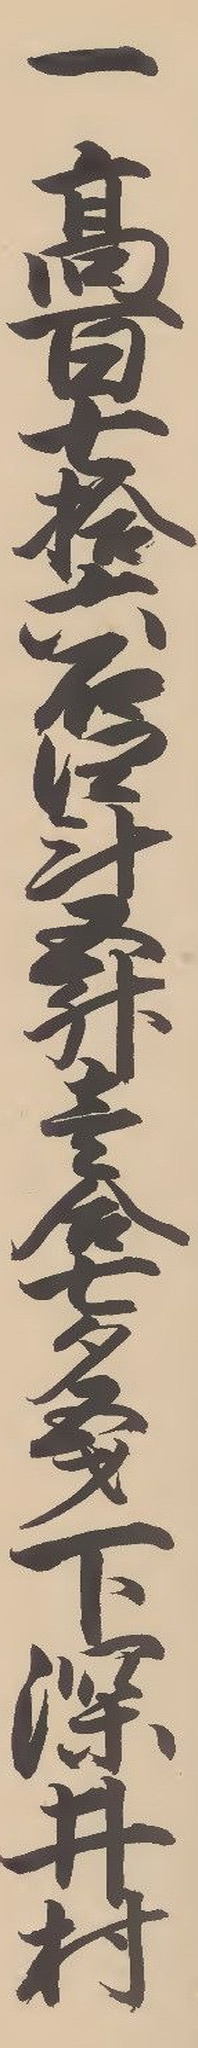一高百七拾六石四斗五升壱合七勺五才下深井村
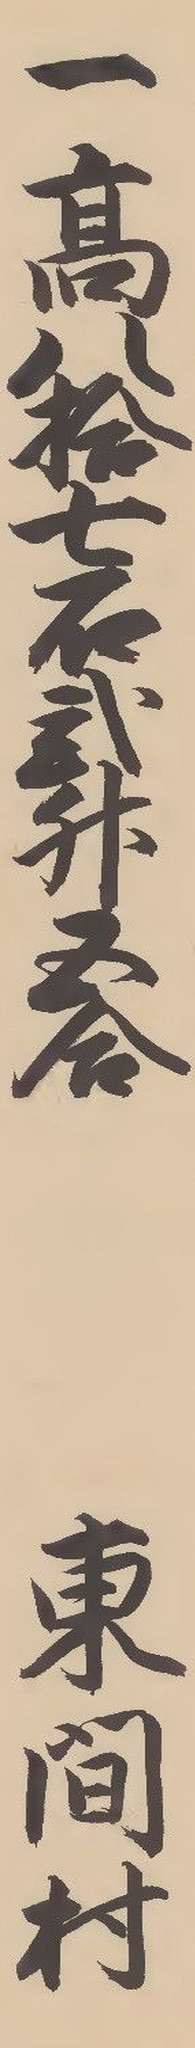一高八拾七石弐升五合東間村
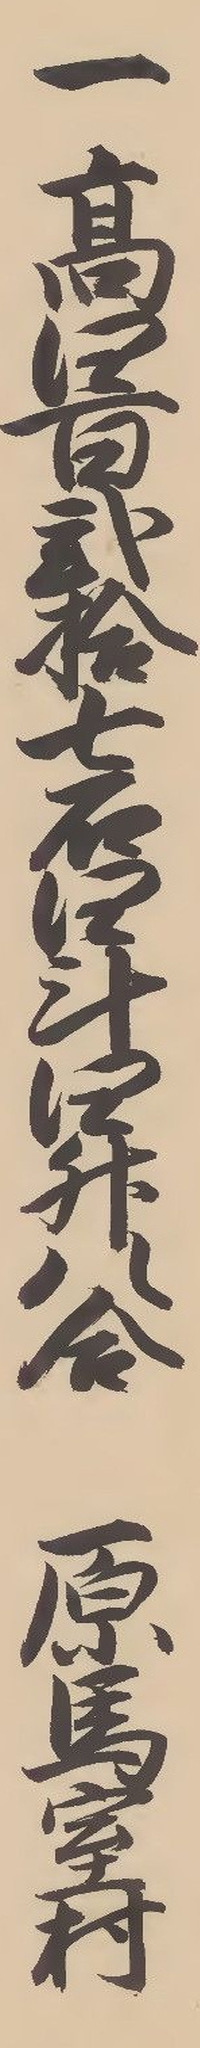一高四百弐拾七石四斗四升八合原馬室村
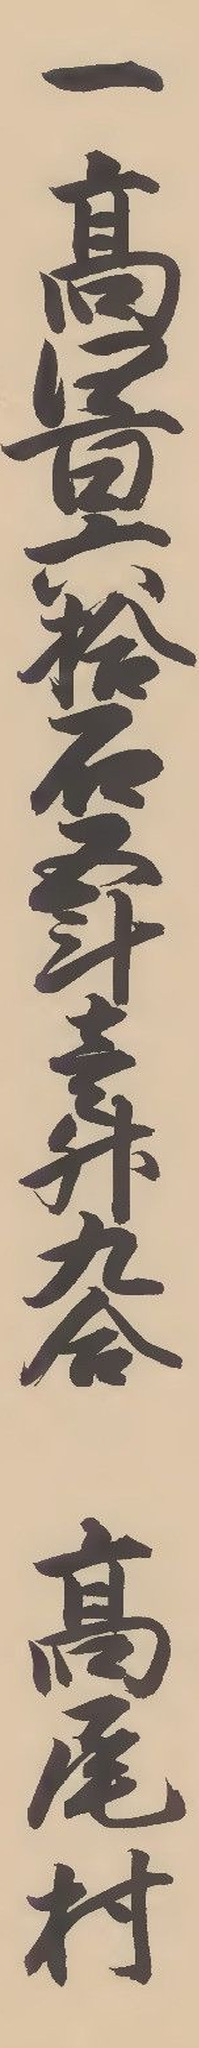一高四百六拾石五斗壱升九合高尾村

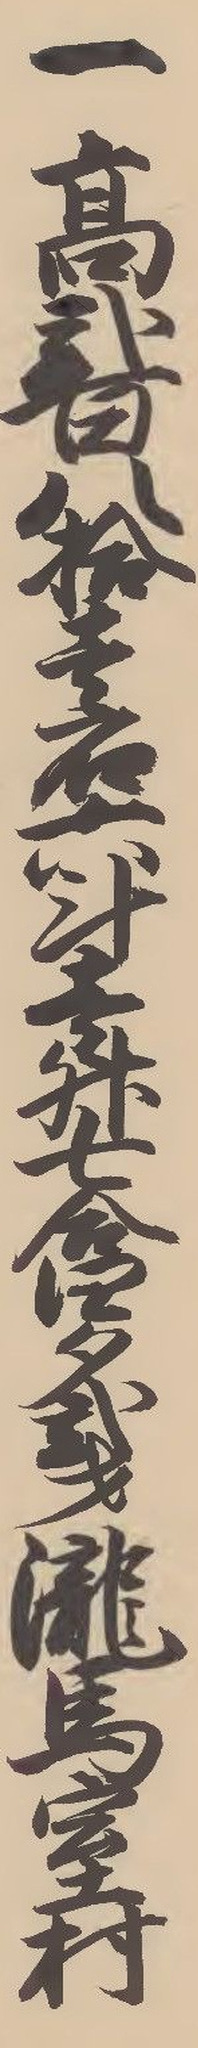一高弐百八拾壱石六斗壱升七合四勺弐才瀧馬室村
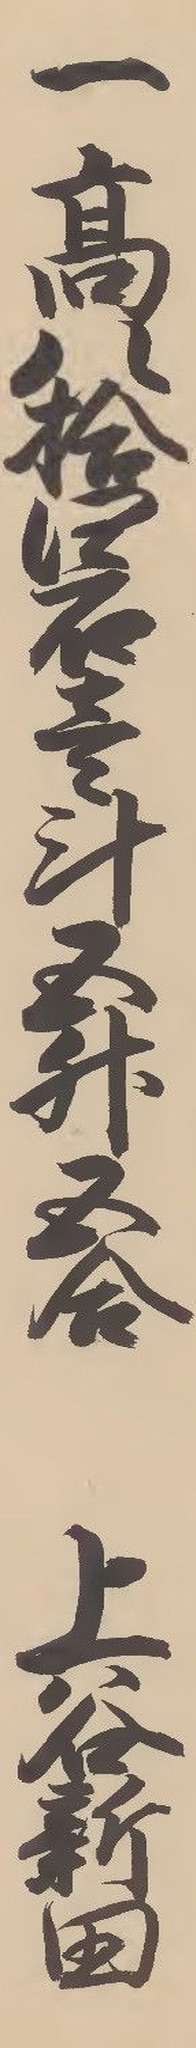一高八拾四石壱斗五升五合上谷新田
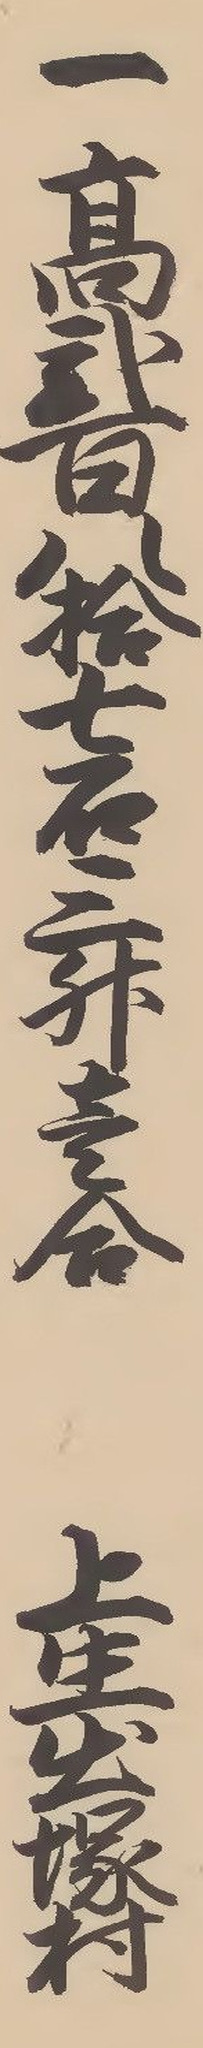一高弐百八拾七石三升壱合上生出塚村
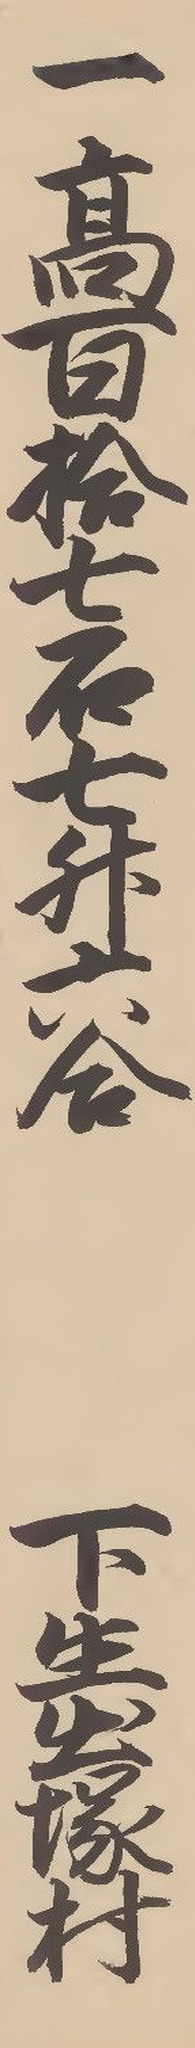一高百拾七石七升六合下生出塚村
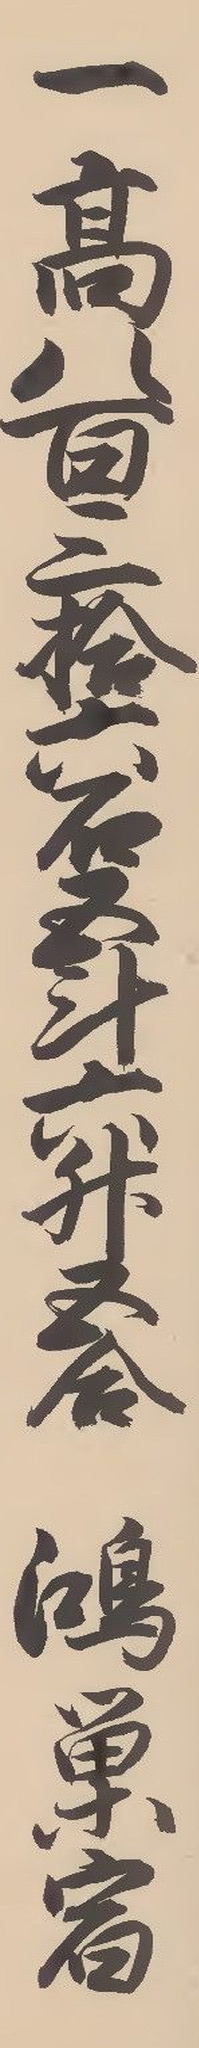一高八百三拾六石五斗六升五合鴻巣宿
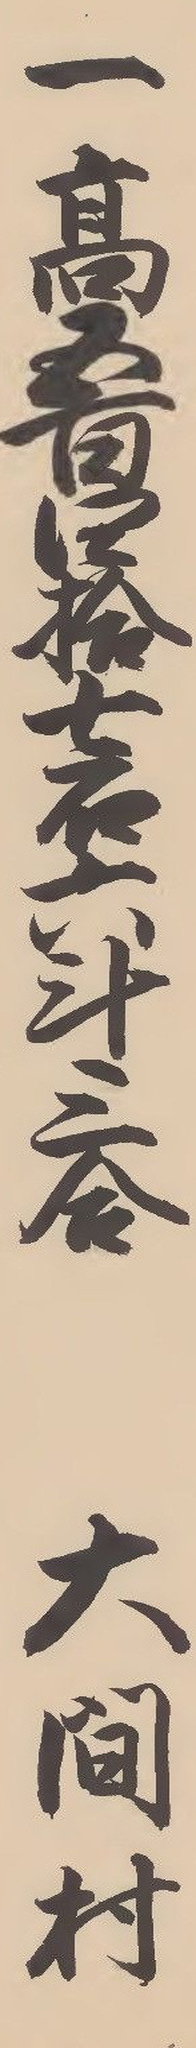一高五百四拾七石六斗三合大間村
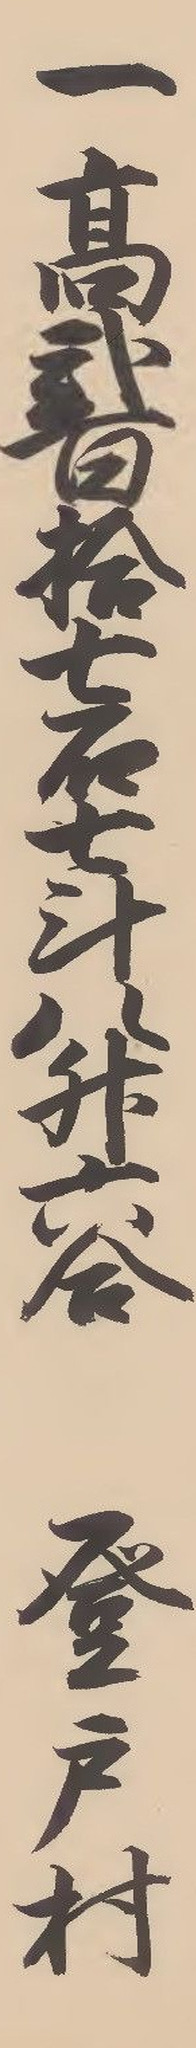一高弐百拾七石七斗八升六合登戸村

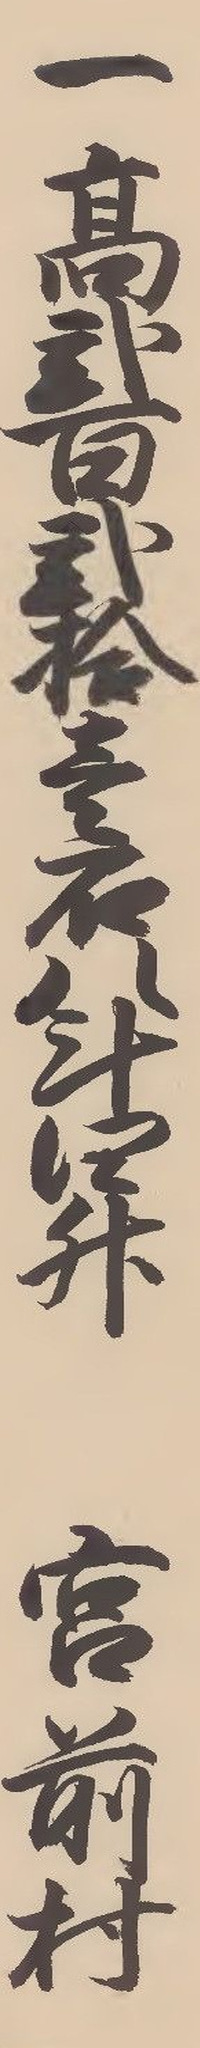一高弐百弐拾壱石八斗四升宮前村
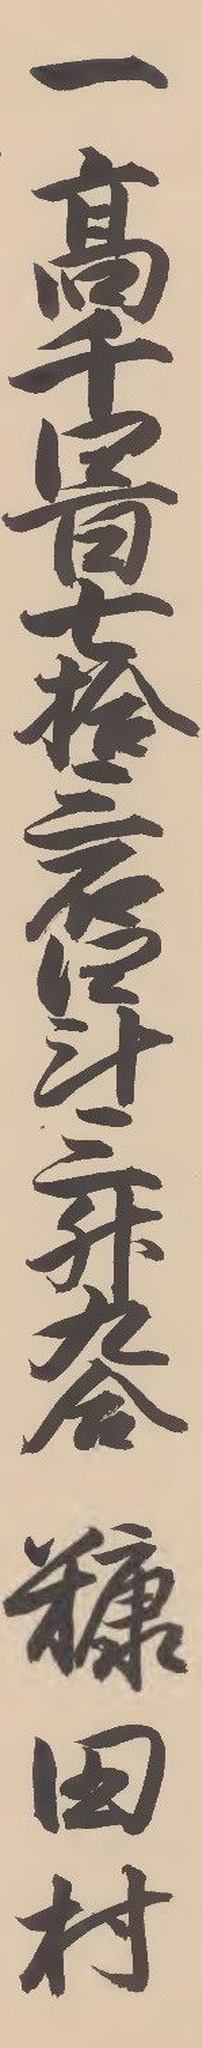一高千四百七拾三石四斗三升九合糠田村
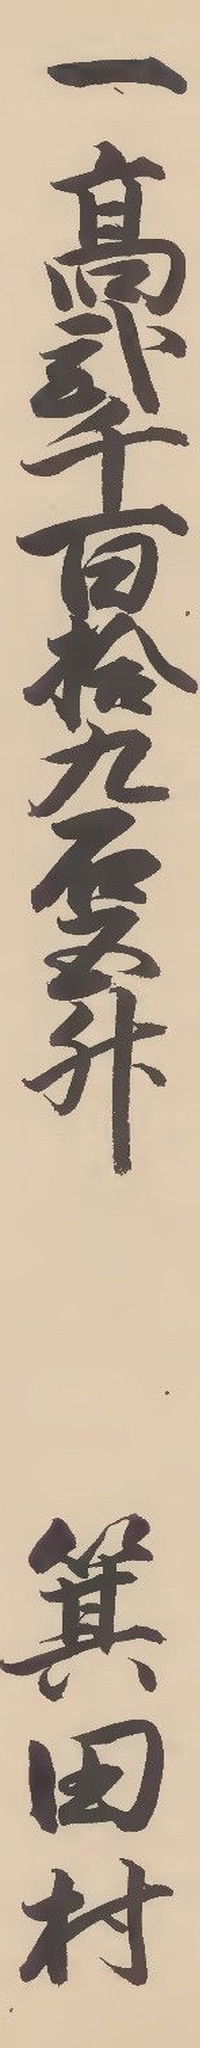一高弐千百拾九石五升箕田村
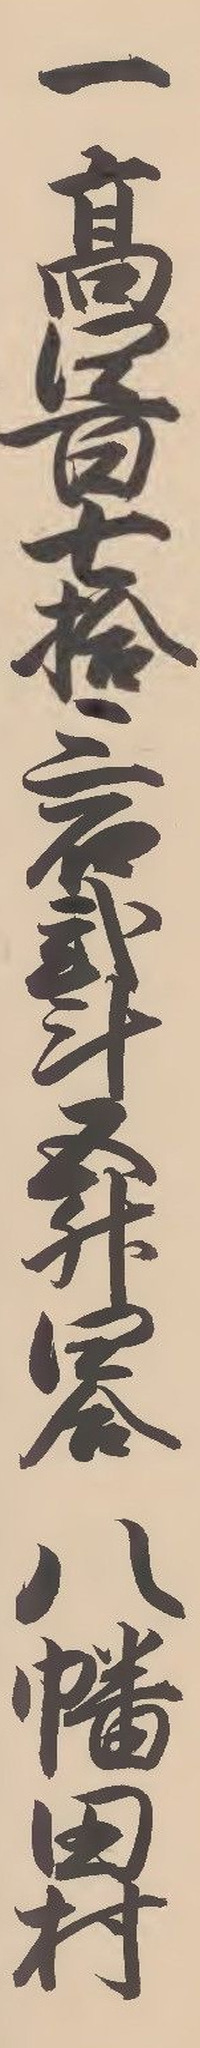一高四百七拾三石弐斗五升四合八幡田村
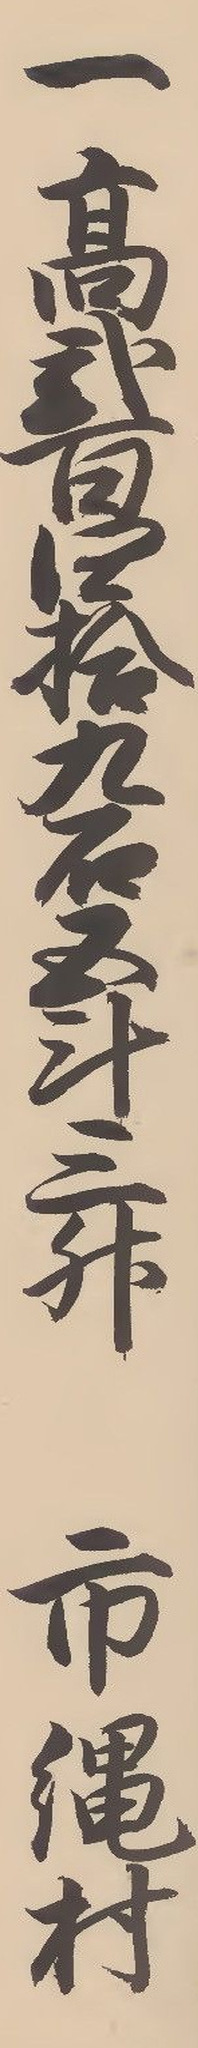一高弐百四拾九石五斗三升市縄村
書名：武蔵国郷帳　下
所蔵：国立公文書館 National Archives of Japan
